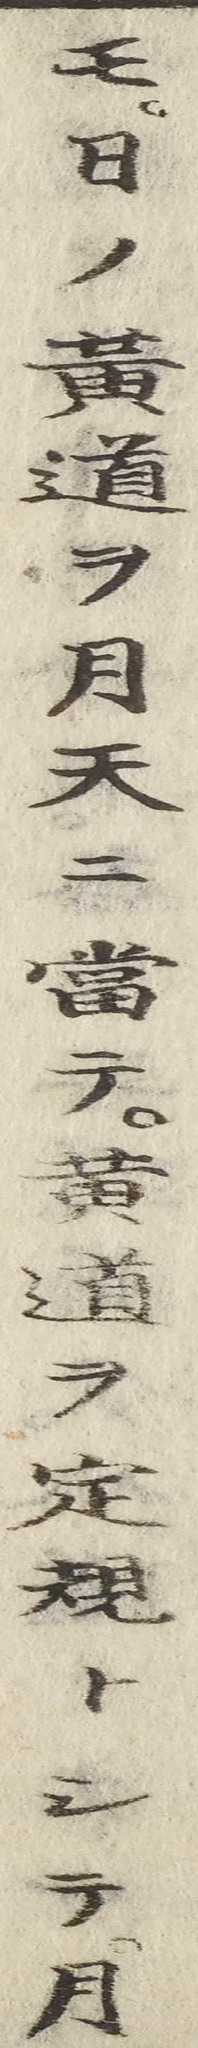モ。日ノ黄道ヲ月天ニ当テ。黄道ヲ定規トシテ。月
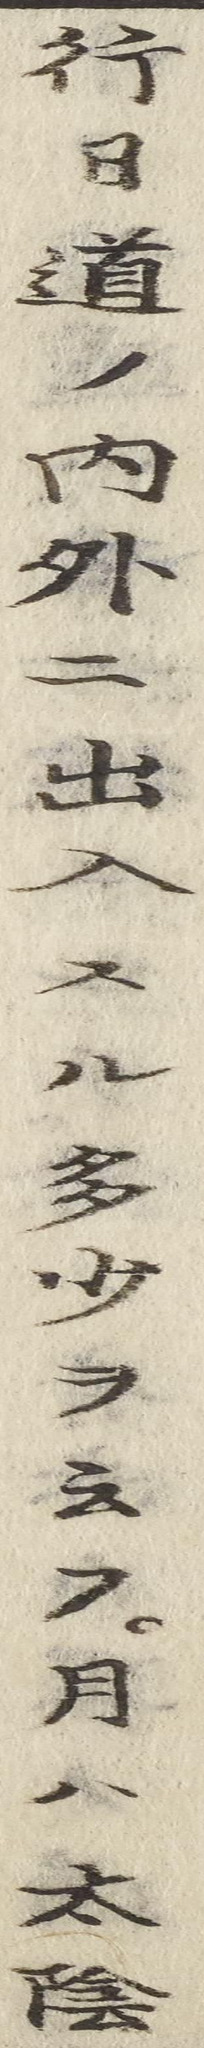行日道ノ内外ニ出入スル多少ヲ云フ。月ハ太陰
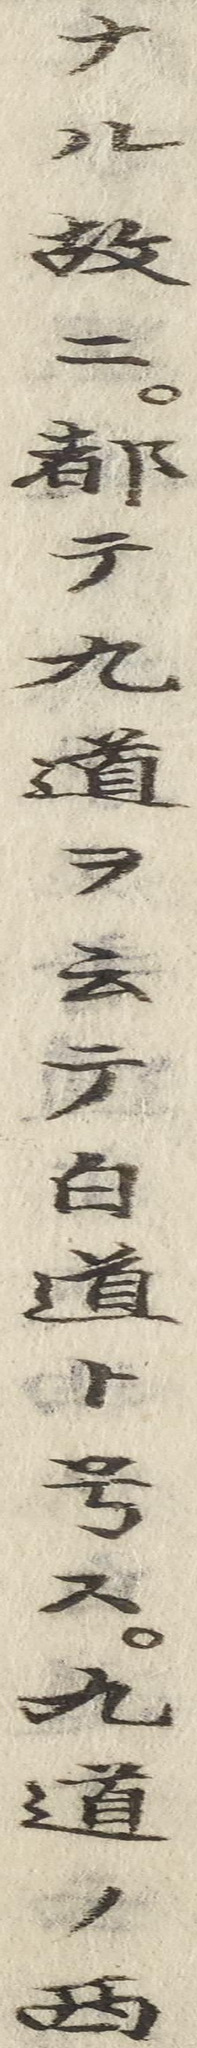ナル故ニ。都テ九道ヲ云テ白道ト号ス。九道ノ西
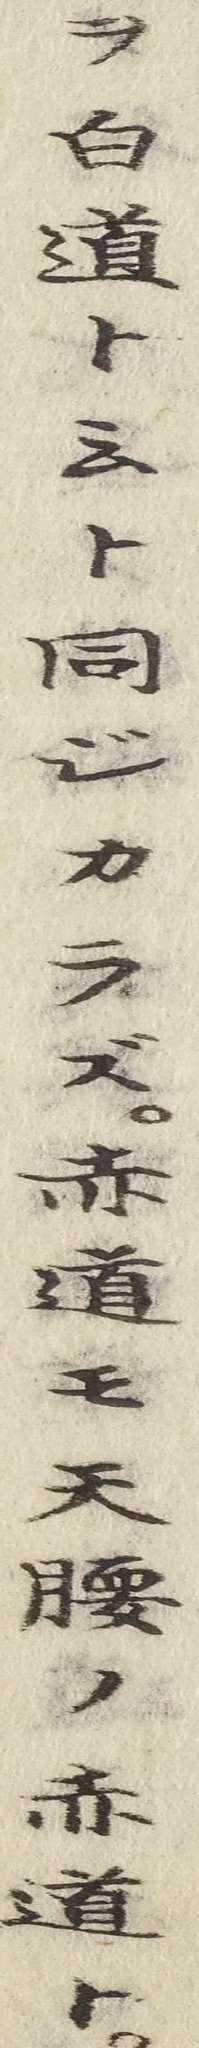ヲ白道ト云ト同ジカラズ。赤道モ天腰ノ赤道ト。
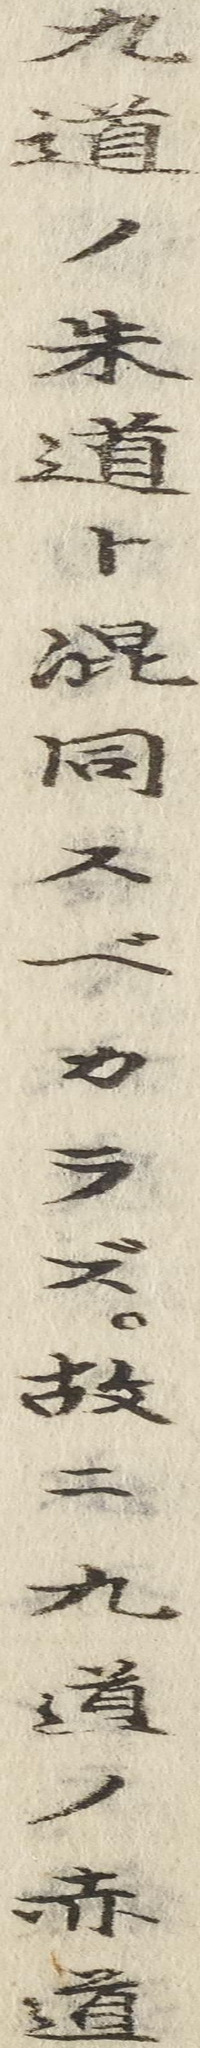九道ノ朱道ト混同スベカラズ。故ニ九道ノ赤道
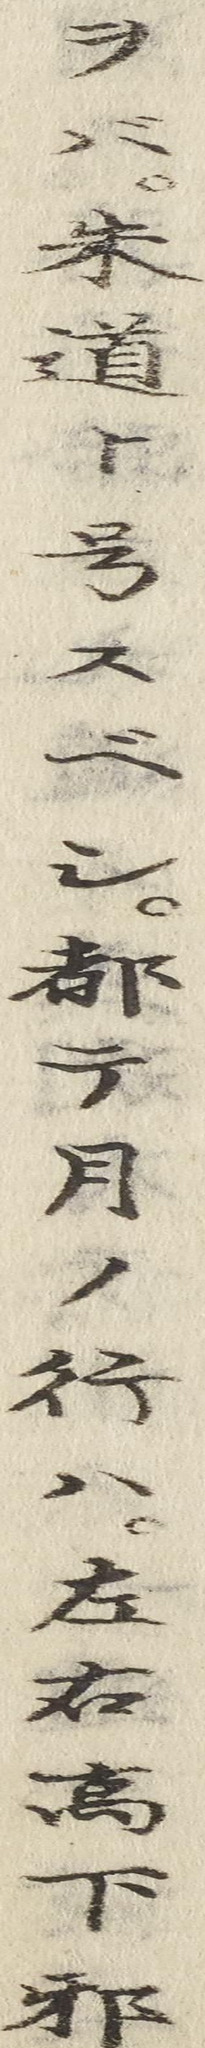ヲバ。朱道ト号スベシ。都テ月ノ行ハ。左右高下邪
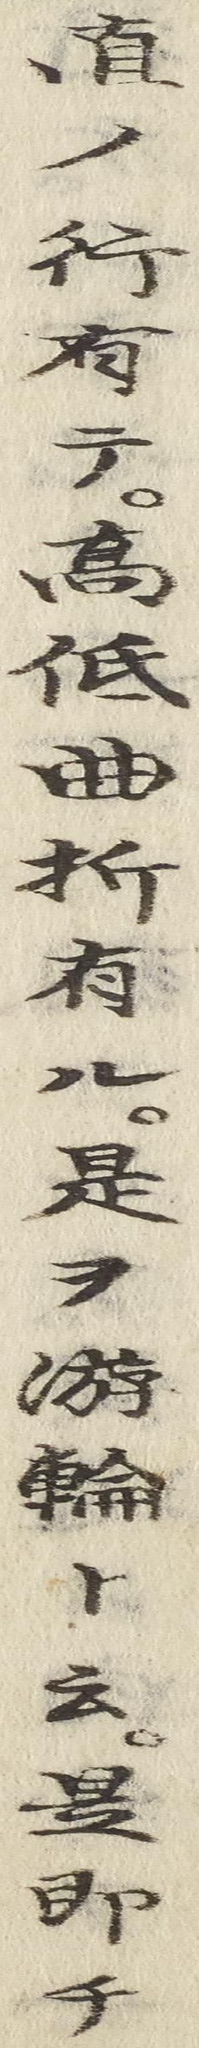直ノ行有テ。高低曲折有ル。是ヲ游輪ト云。是即チ
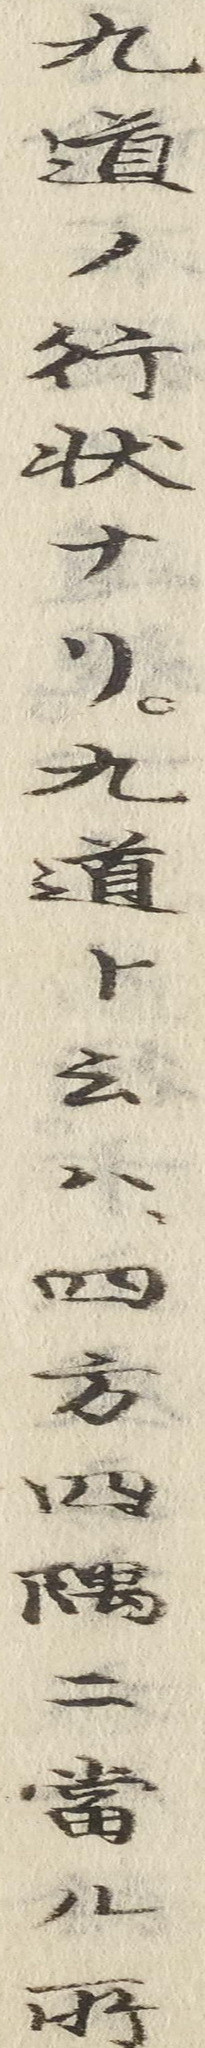九道ノ行状ナリ。九道ト云ハ。四方四隅ニ当ル所
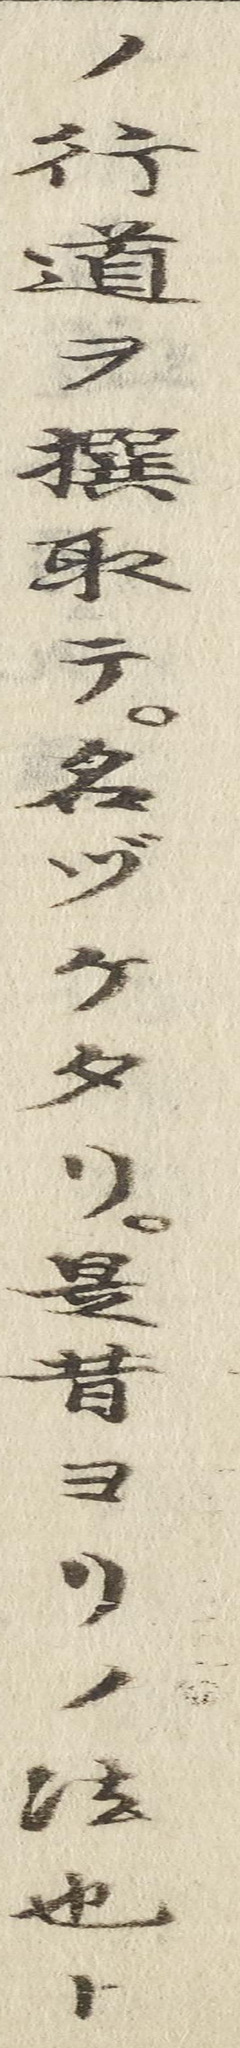ノ行道ヲ撰取テ。名ヅケタリ。是昔ヨリノ法也ト
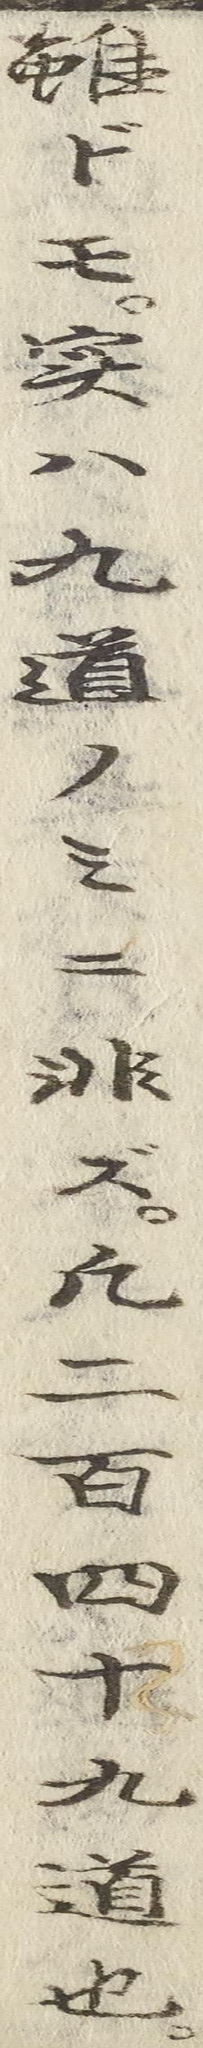雖ドモ。突ハ九道ノミニ非ズ。凡二百四十九道也。
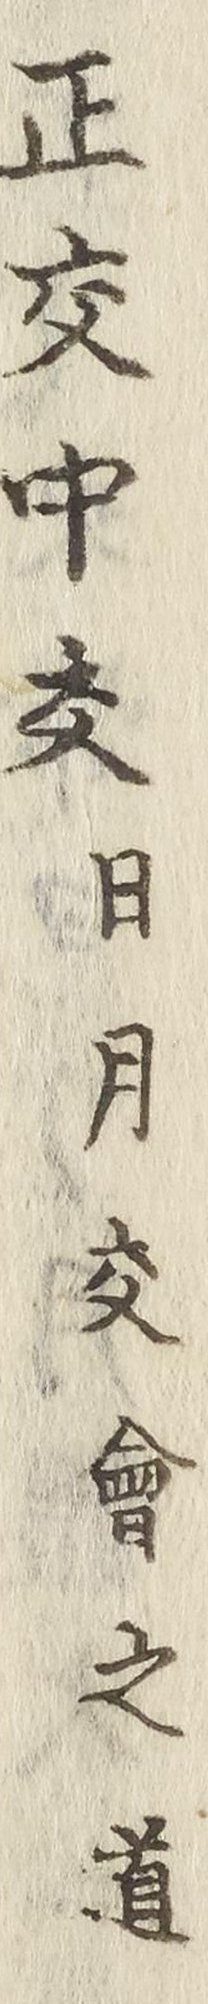正交中交日月交会之道
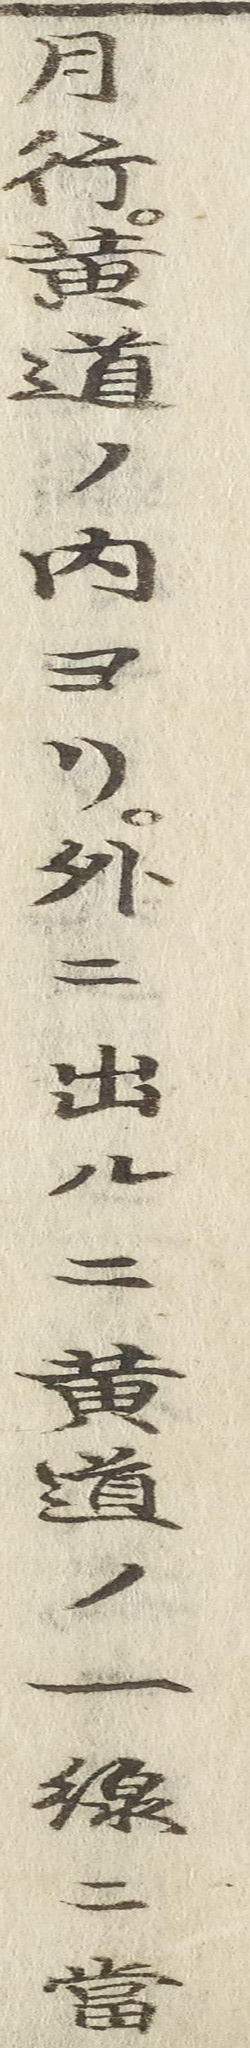月行。黄道ノ内ヨリ。外ニ出ルニ黄道ノ一線ニ当
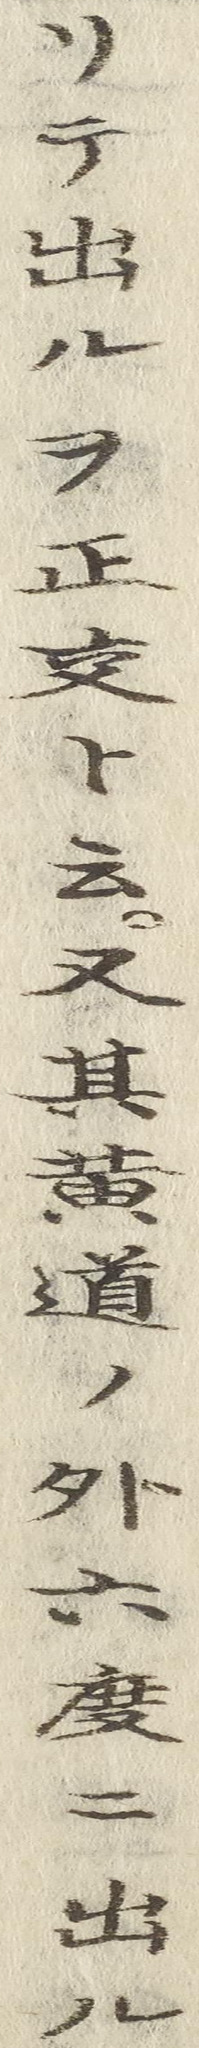リテ出ルヲ正交ト云。又其黄道ノ外六度ニ出ル
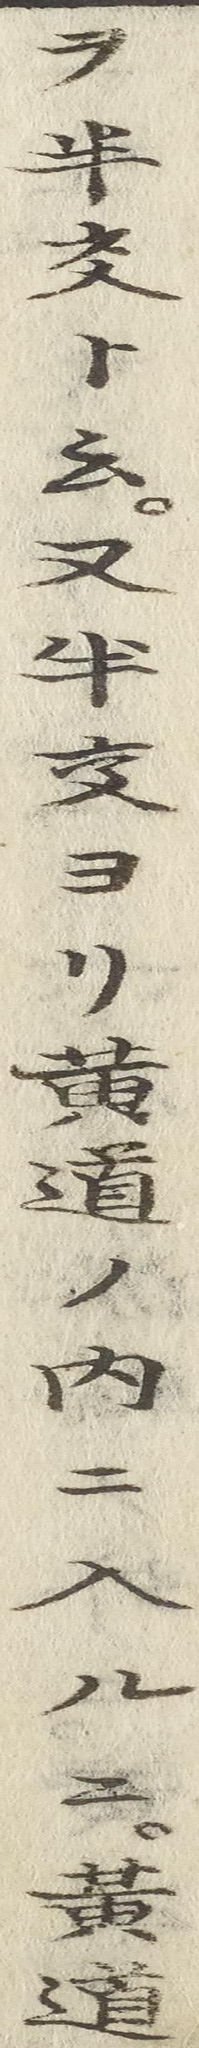ヲ半交ト云。又半交ヨリ黄道ノ内ニ入ルニ。黄道
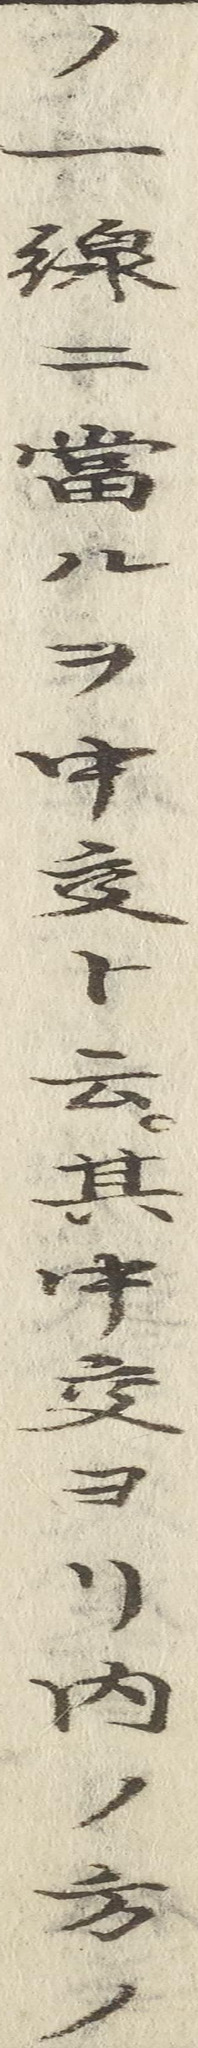ノ一線ニ当ルヲ中交ト云。其中交ヨリ内ノ方ノ
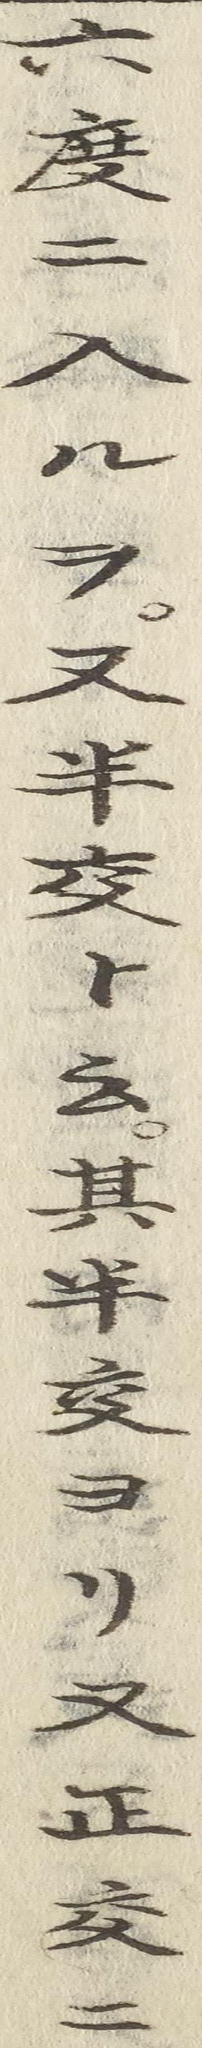六度ニ入ルヲ。又半交ト云。其半交ヨリ又正交ニ
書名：大略天学名目鈔　天經或問附録
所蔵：東京大学地震研究所図書室 Earthquake Research Institute Library, The University of Tokyo, JAPAN
